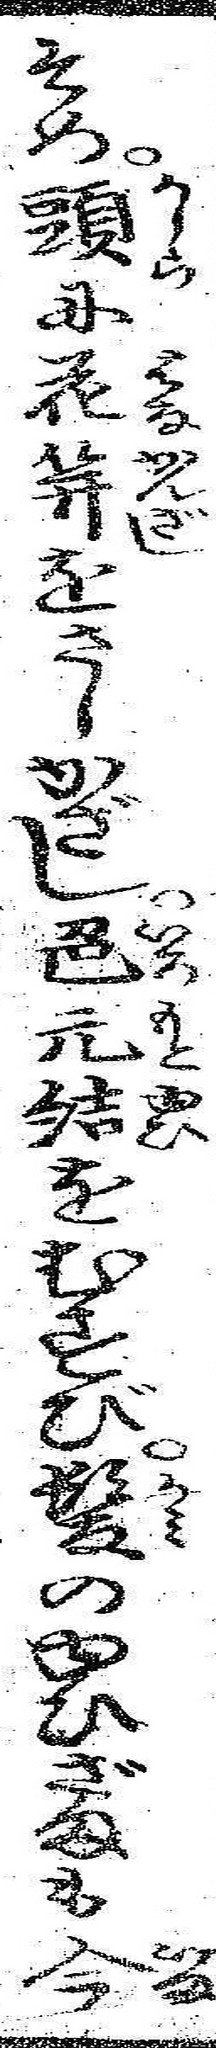そめ。頭に花笄をさしかざし。色元結をむすび。髪のゆひざまも今
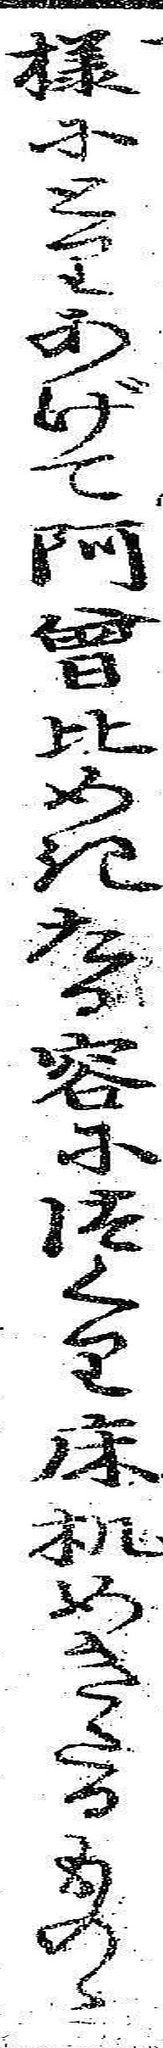様にとりあげて。阿曽比めきたる容につくり。床机めきたるものゝ
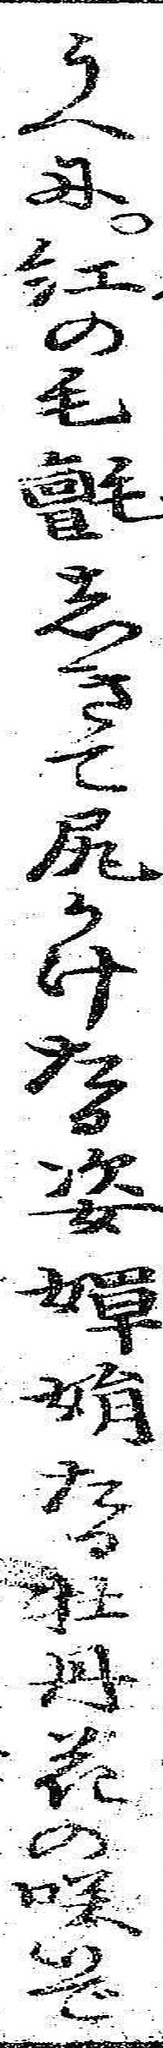うへに。紅の毛氈しきて尻かけたる姿嬋娟たる壮丹花の咲いで
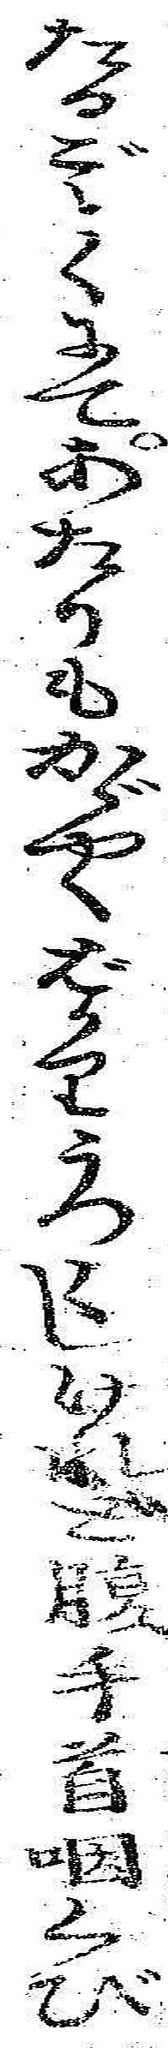たるごとくにて。あたりもかゞやくばかりうつくしけれど腹手首咽くび
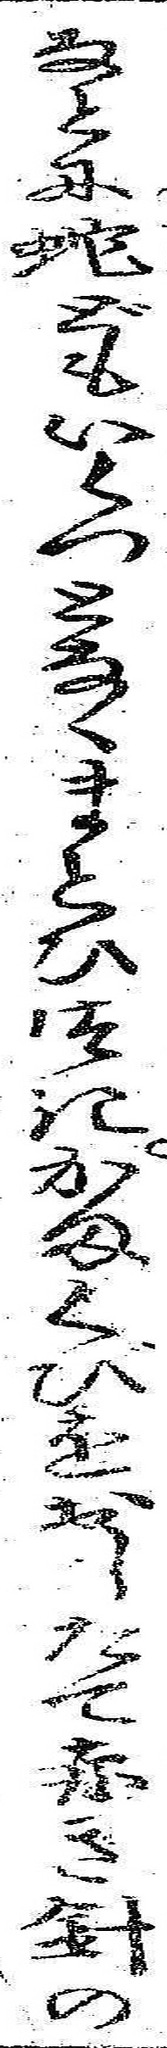なとに。蛇どもいくつとなくまとひつき。かまくびをおしたて赤き針の
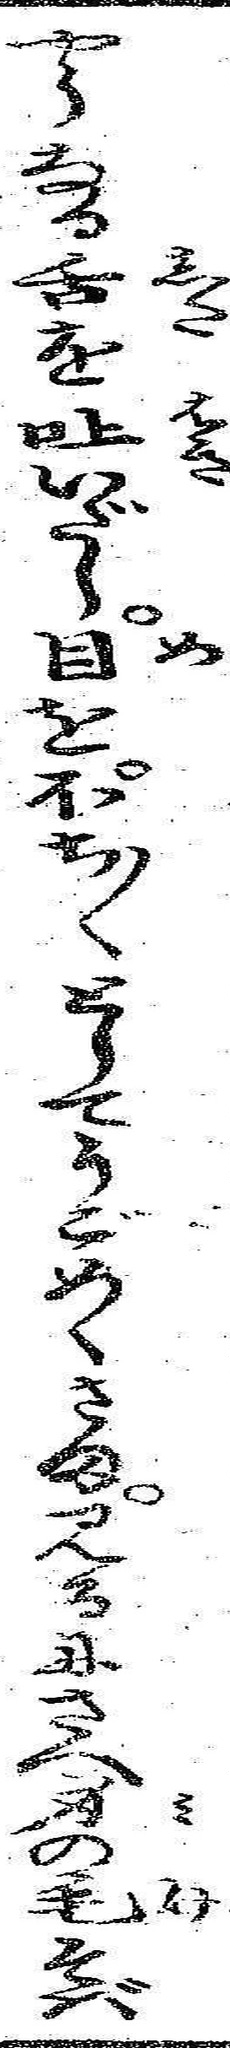やうなる舌を吐いだし。目をぽち〳〵としてうごめくさま。見るにさへ身の毛そば
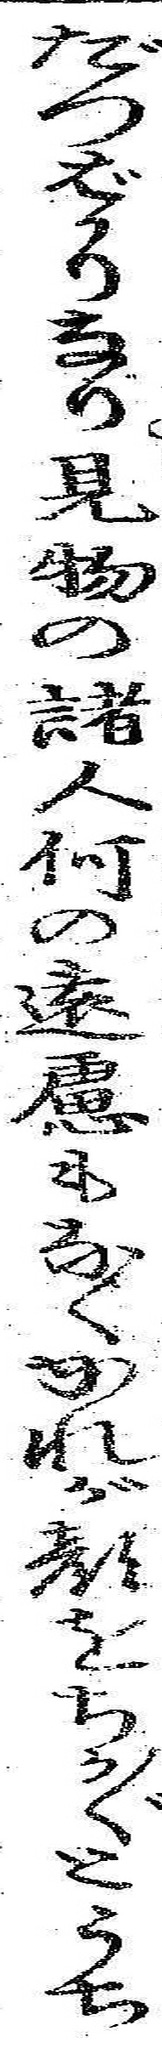だつばかりなり。見物の諸人何の遠慮もなくかれが顔をちか〴〵とうち
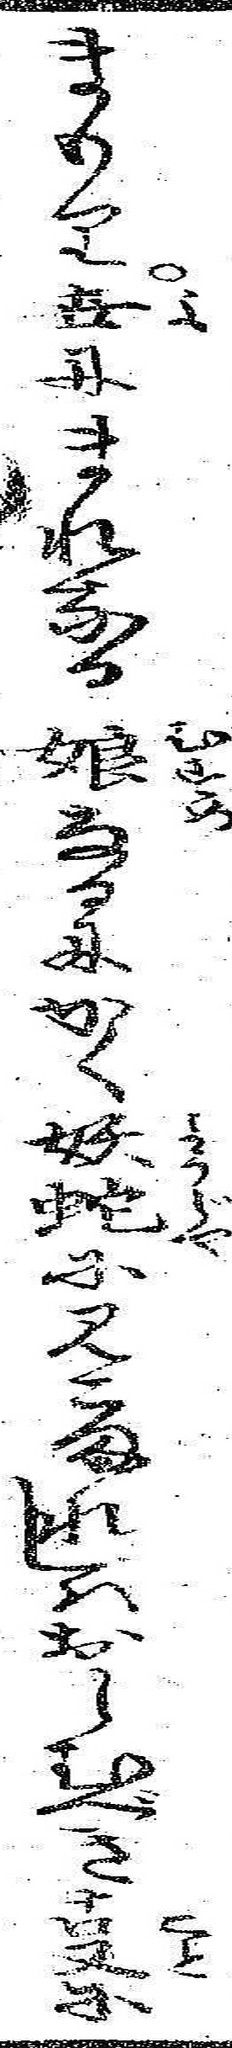まもり。世にまれなる娘なるにかく妖蛇に見こまれしはおしむべき事に
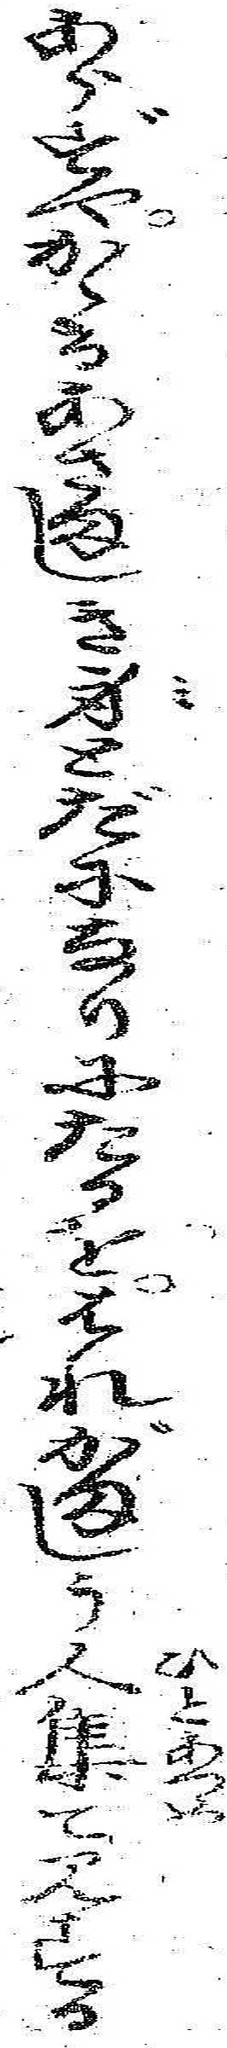あらずや。かゝるあさましき身とだになりにたるを。はれがましう人集て見する
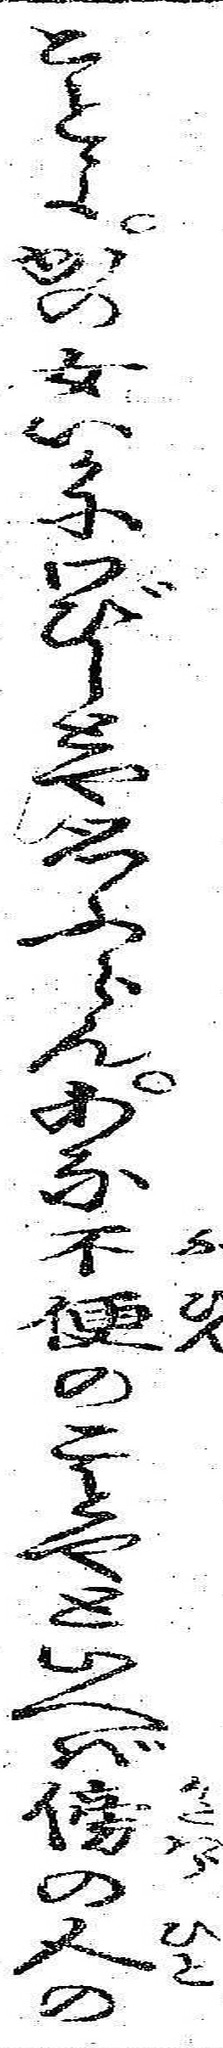ことよ。かの女いかにわびしとや思ふらん。あな不便のことやといへば傍の人の
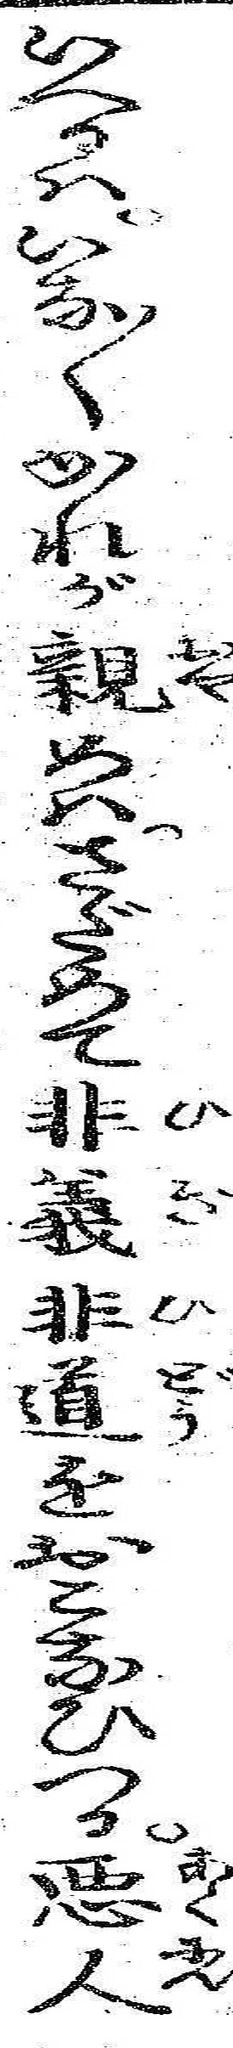いへるは。いな〳〵かれが親めは。さだめて非義非道をおこなひつる。悪人
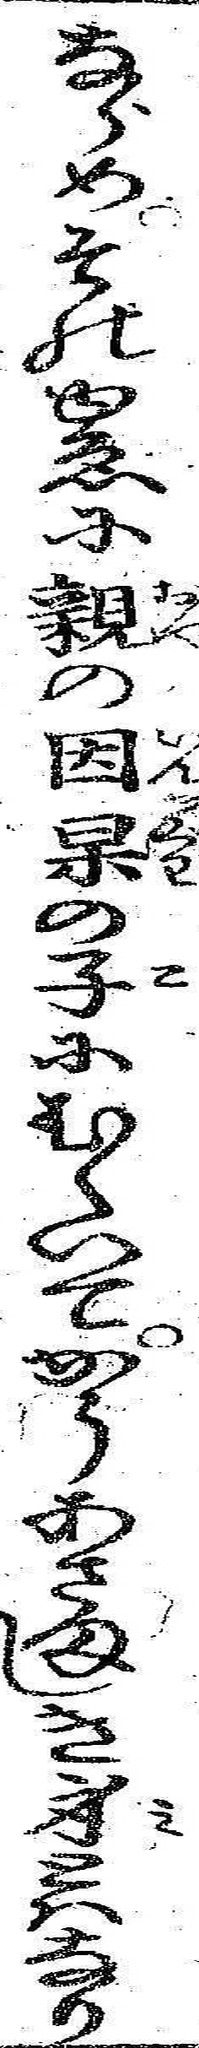ならめ。そのゆゑに親の因果の子にむくいて。かうあさましき身とはなり
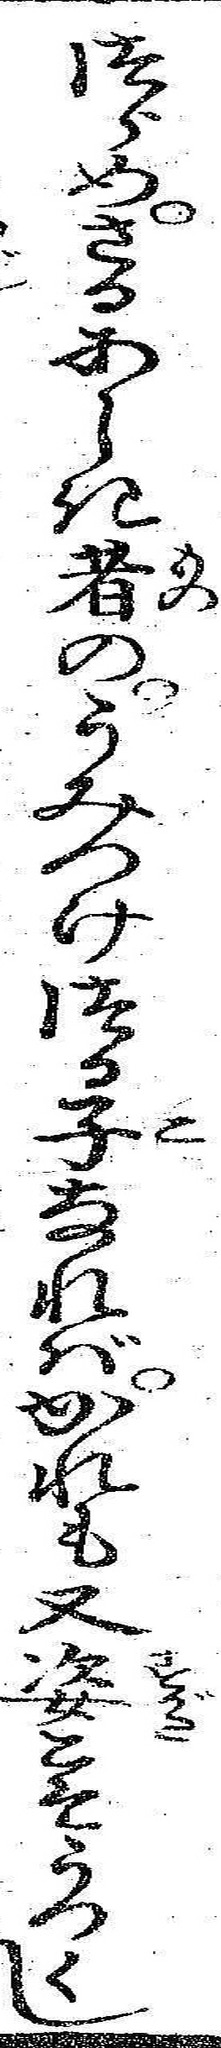つらめ。さるあしき者の。うみつけつる子なれば。かれも又姿こそうつくし
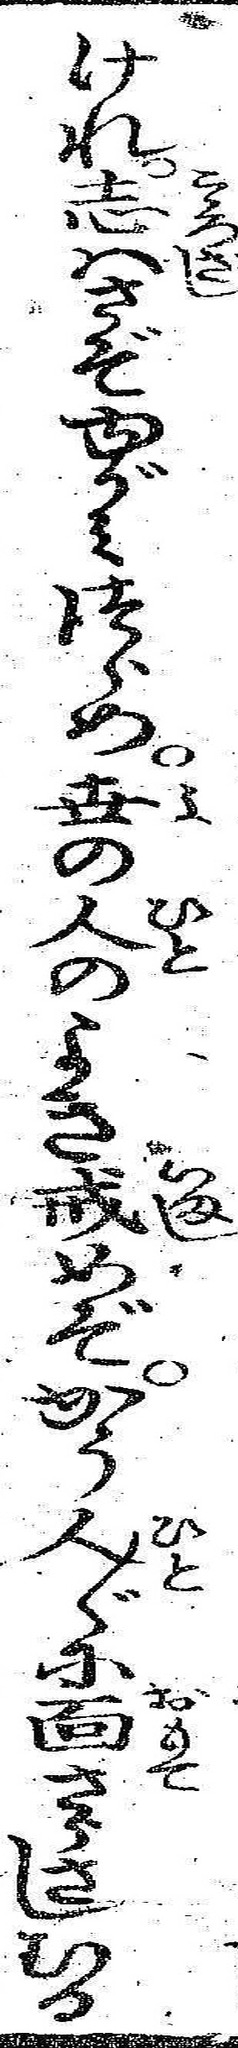けれ。志はさぞゆがみつらめ。世の人のよき戒めぞ。かう人〴〵に面さらさしむる
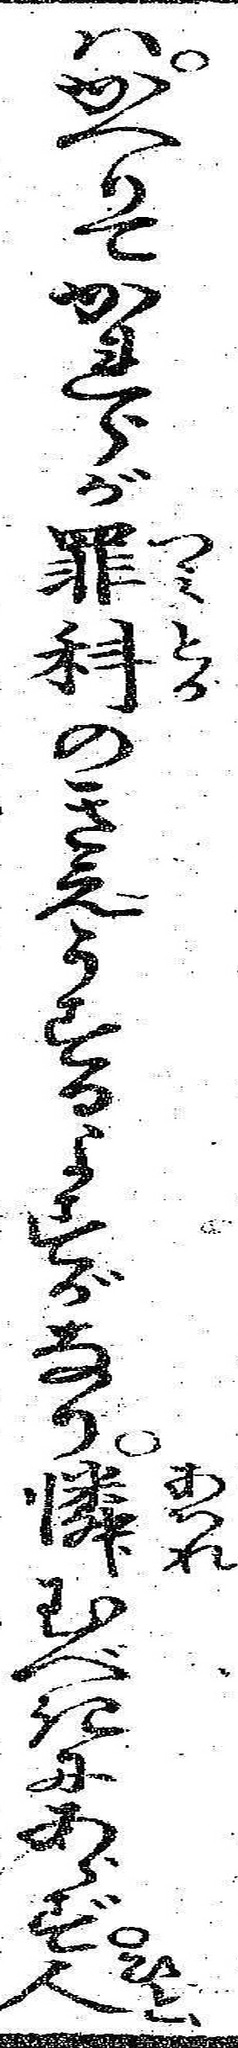は。かへりてかれらが罪科のきえうするよすがなり。憐むべきにあらず。人
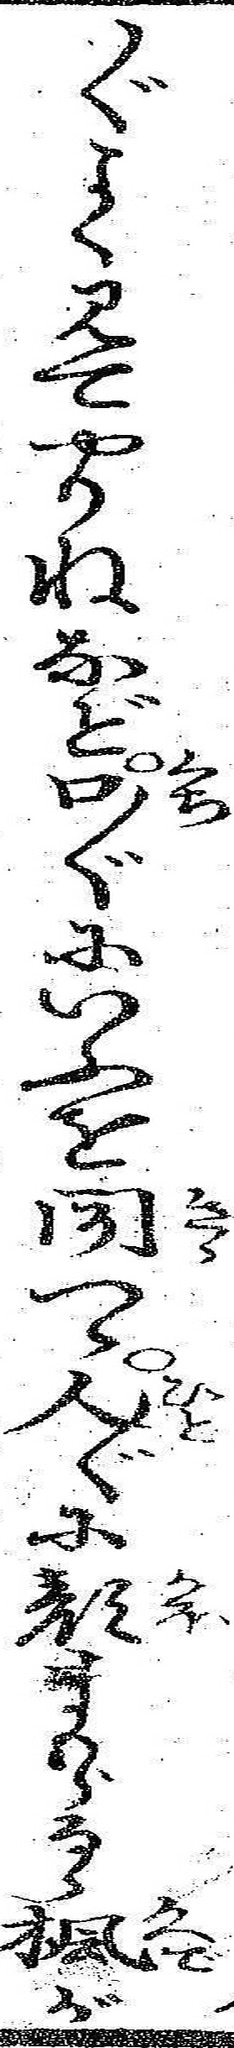〴〵よく見てやりねなど。口〴〵にいふを聞つゝ。人〴〵に顔まもらるゝ楓が
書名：昔話稲妻表紙
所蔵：国文学研究資料館
